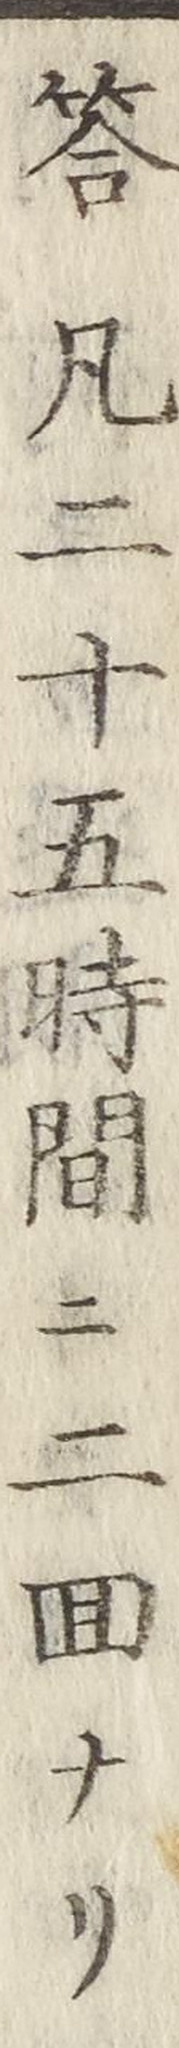答凡二十五時間ニ二回ナリ
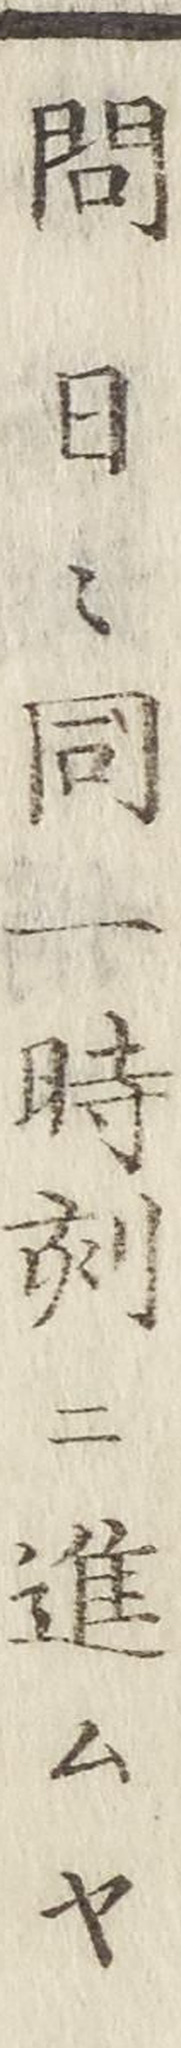問日々同一時刻ニ進ムヤ
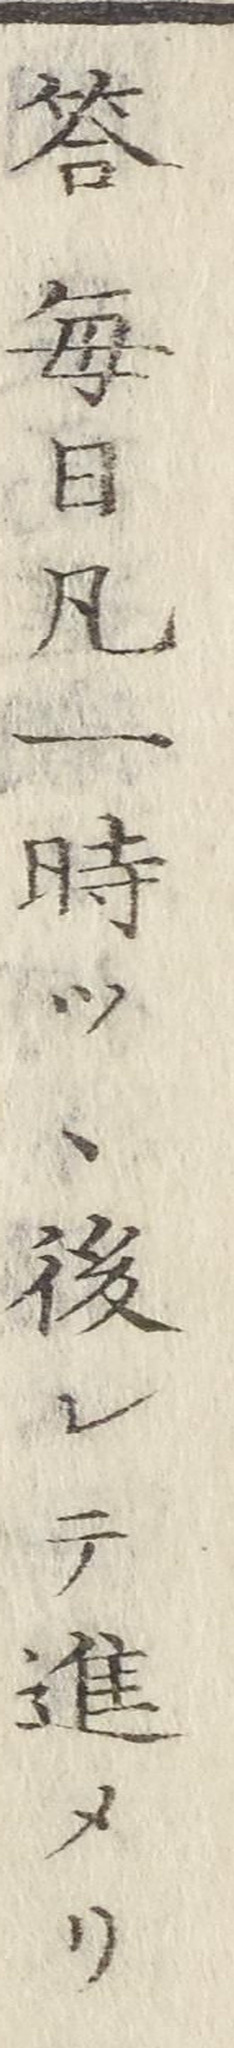答毎日凡一時ツヽ後レテ進メリ
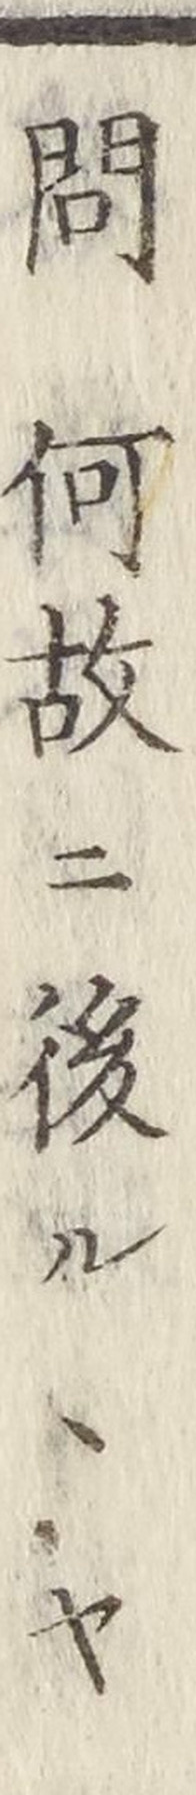問何故ニ後ルヽヤ
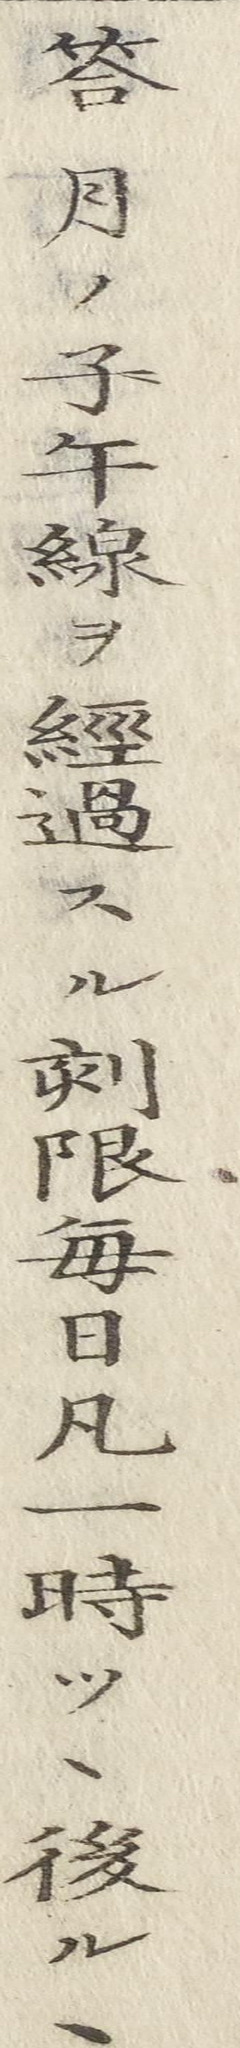答月ノ子午線ヲ経過スル刻限毎日凡一時ツヽ後ルヽ
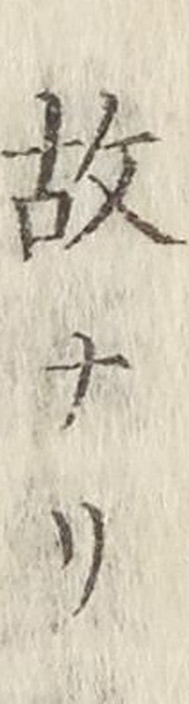故ナリ
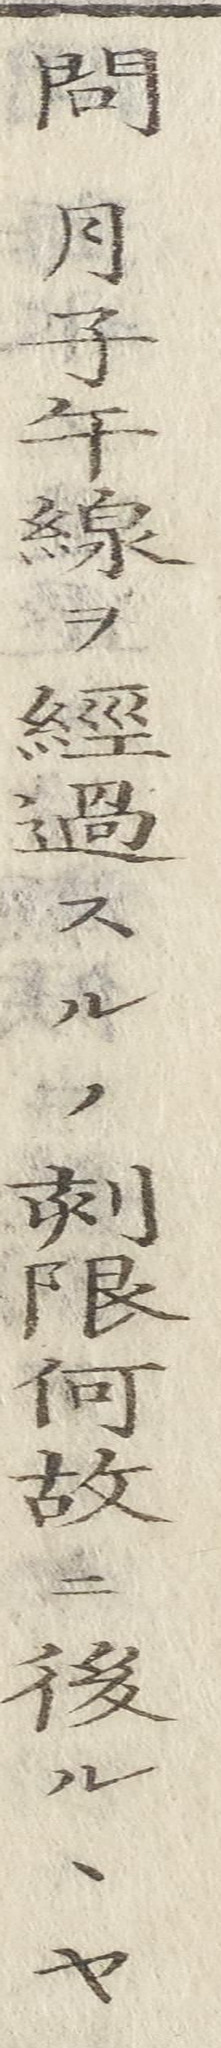問月子午線ヲ経過スルノ刻限何故ニ後ルヽヤ
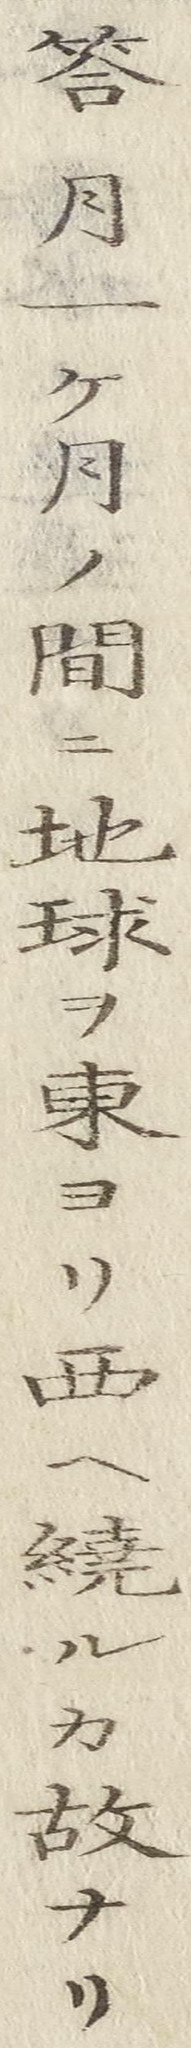答月一ヶ月ノ間ニ地球ヲ東ヨリ西ヘ繞ルカ故ナリ
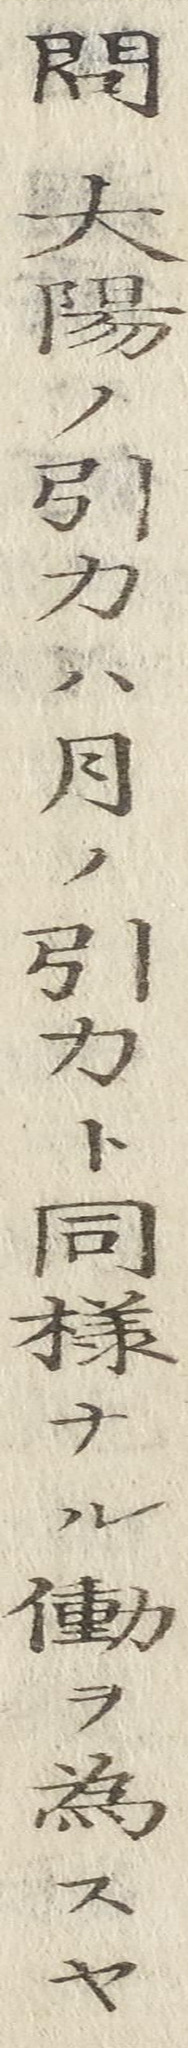問大陽ノ引力ハ月ノ引力ト同様ナル働ヲ為スヤ
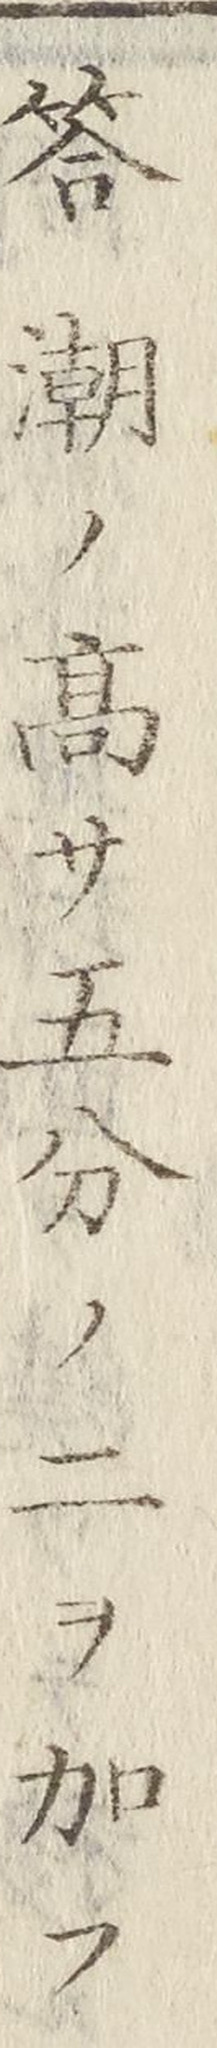答潮ノ高サ五分ノ二ヲ加フ
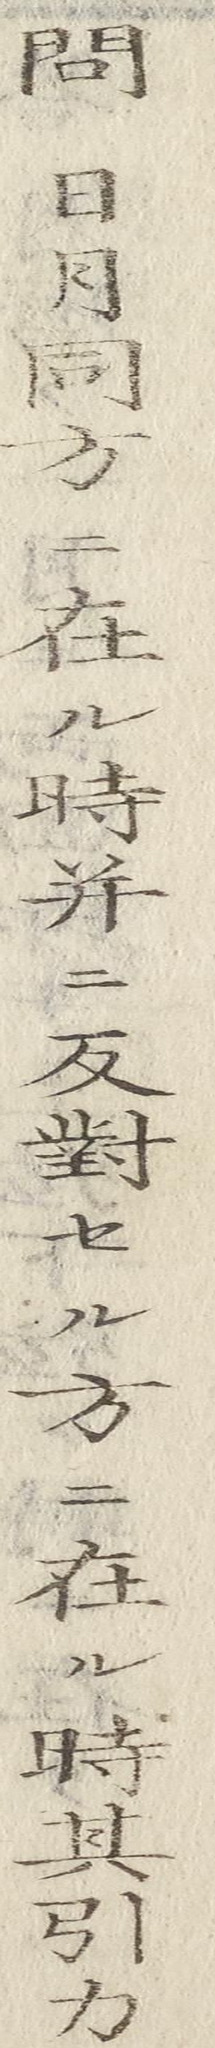問日月同方ニ在ル時幷ニ反対セル方ニ在ル時其引力
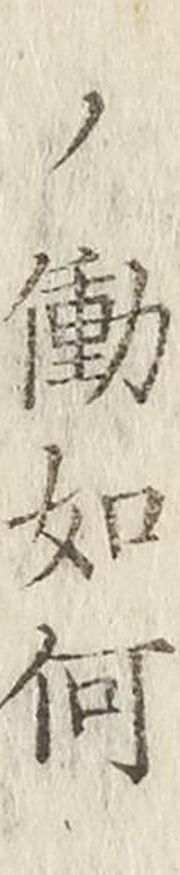ノ働如何
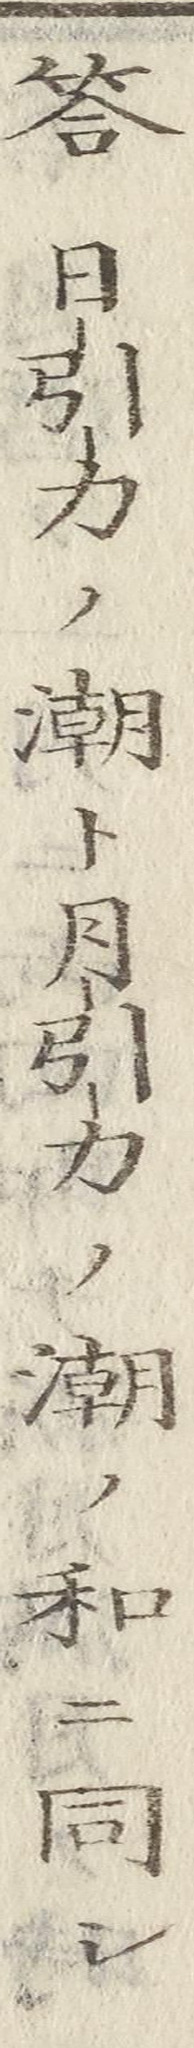答日-引-力ノ潮ト月-引-力ノ潮ノ和ニ同シ
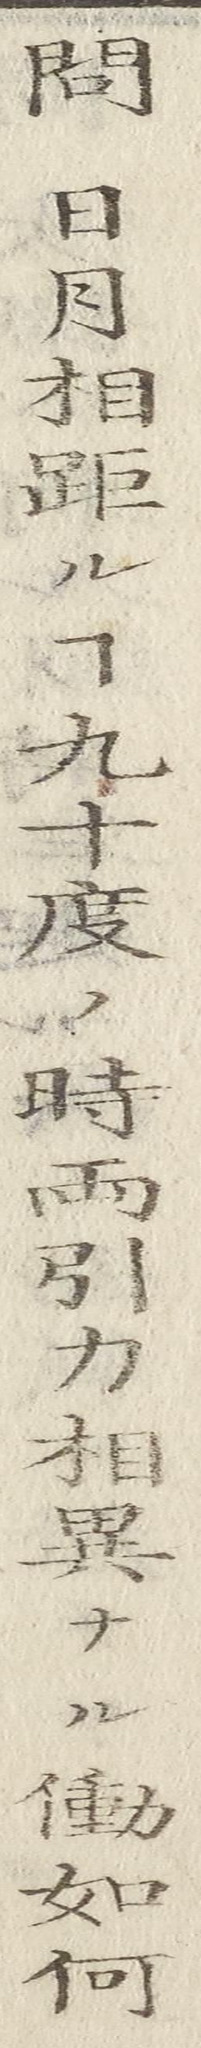問日月相距ルコト九十度ノ時両引力相異ナル働如何
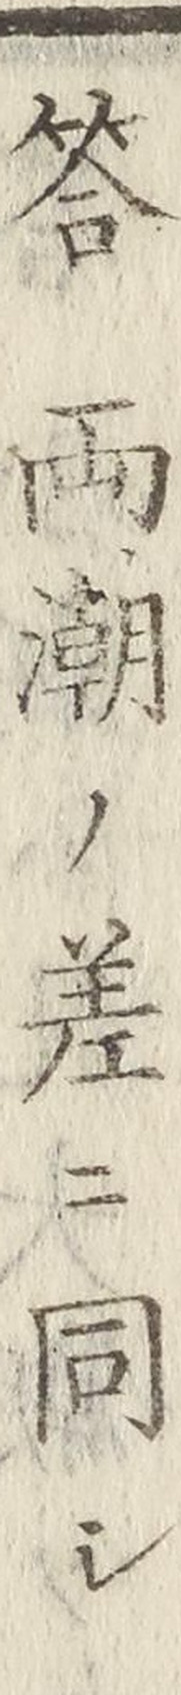答両潮ノ差ニ同シ
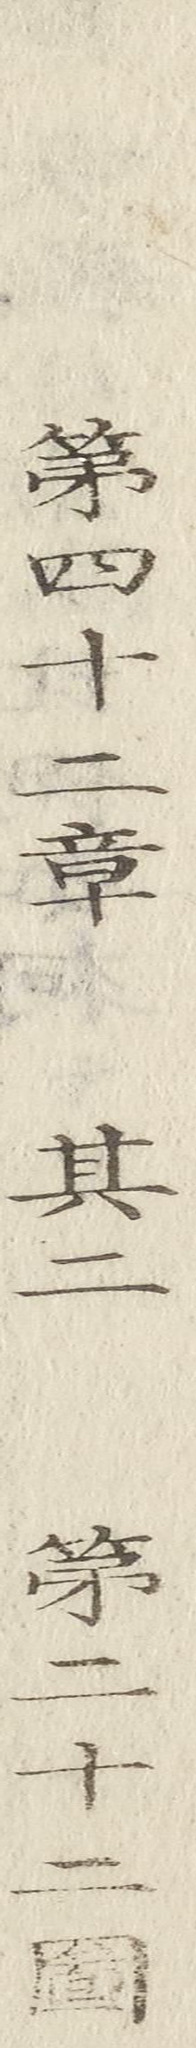第四十二章其二第二十二図
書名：星学圖説　下
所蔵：東京大学地震研究所図書室 Earthquake Research Institute Library, The University of Tokyo, JAPAN
